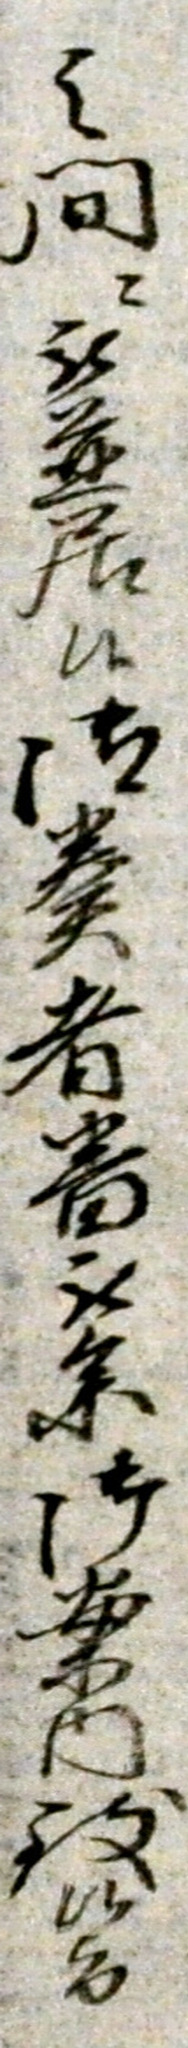之間ニ被並居候御奏者番被参御案内致候旨
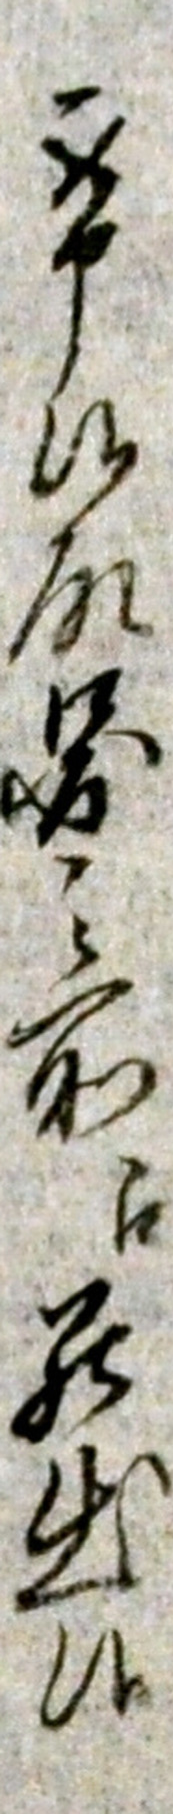被申候故圖之所え罷出候
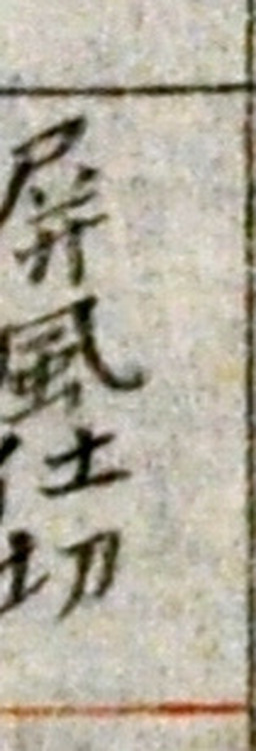屏風仕切

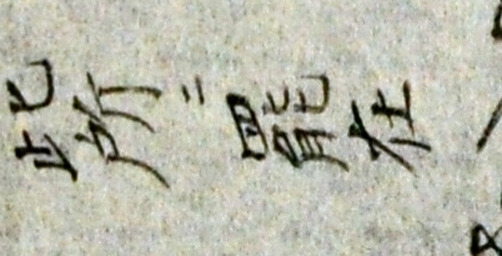此所ニ罷在
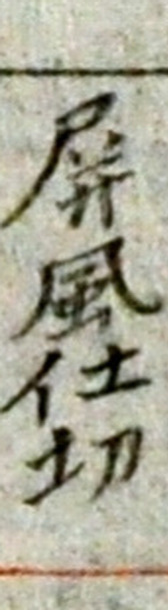屏風仕切
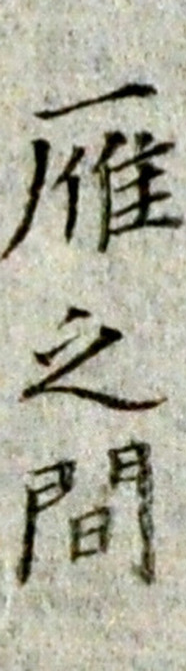雁之間
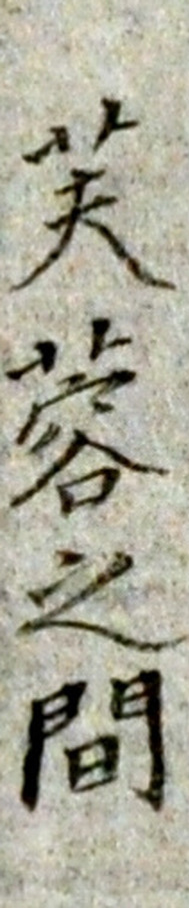芙蓉之間
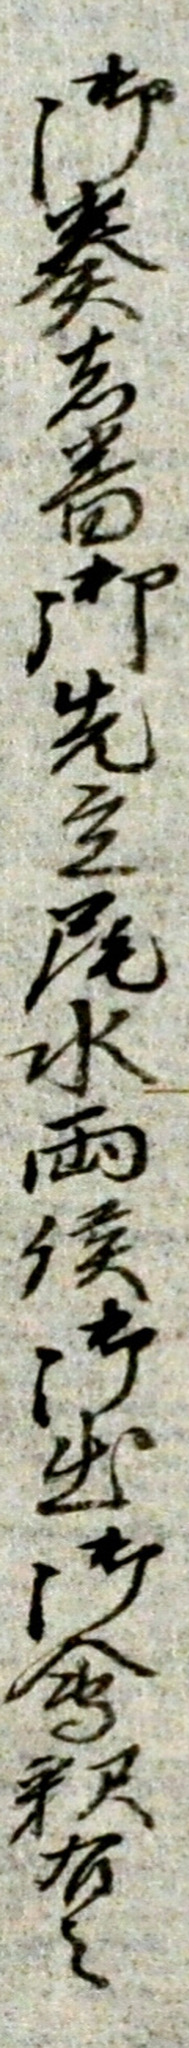御奏者番御先立尾水両侯御出御會釈有之
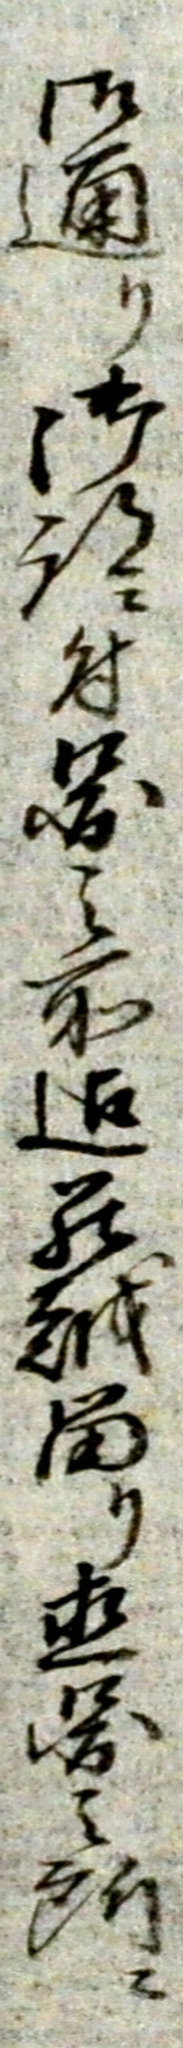御通り御跡ニ付圖之所迄罷越留り直圖之所ニ
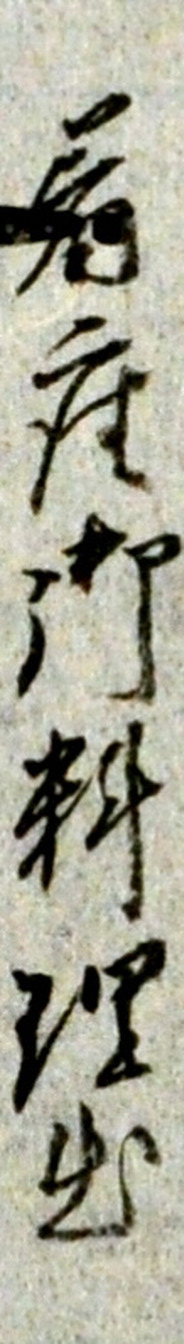着座御料理出
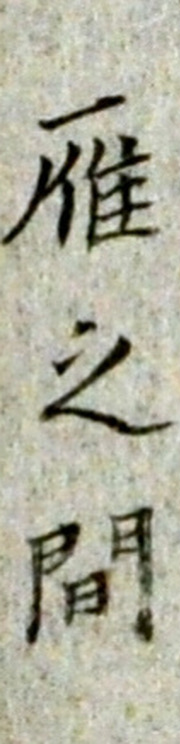雁之間
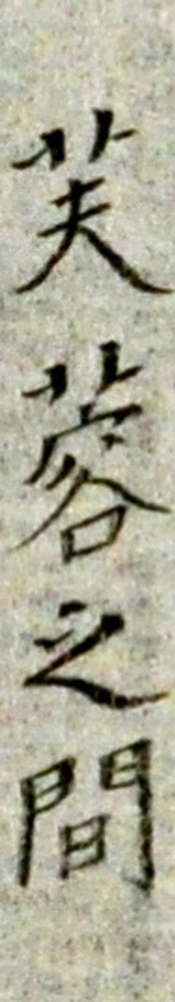芙蓉之間

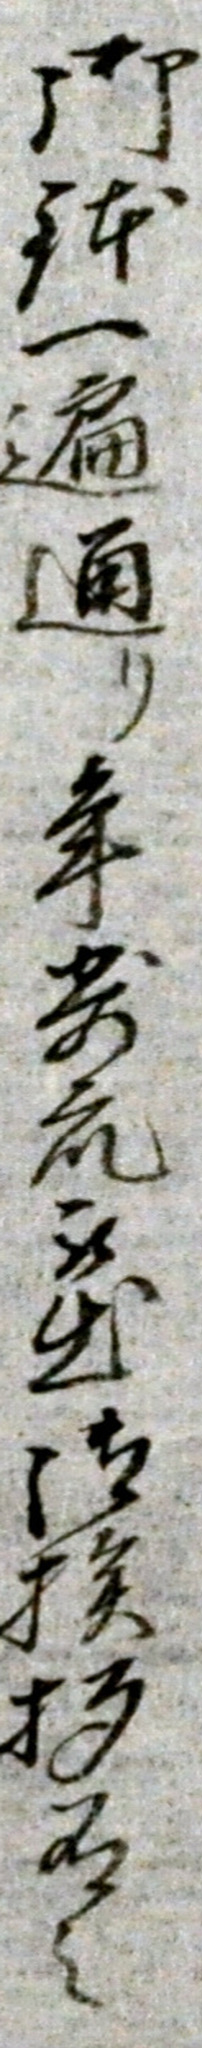御鉢一遍通り年寄衆被出御挨拶有之
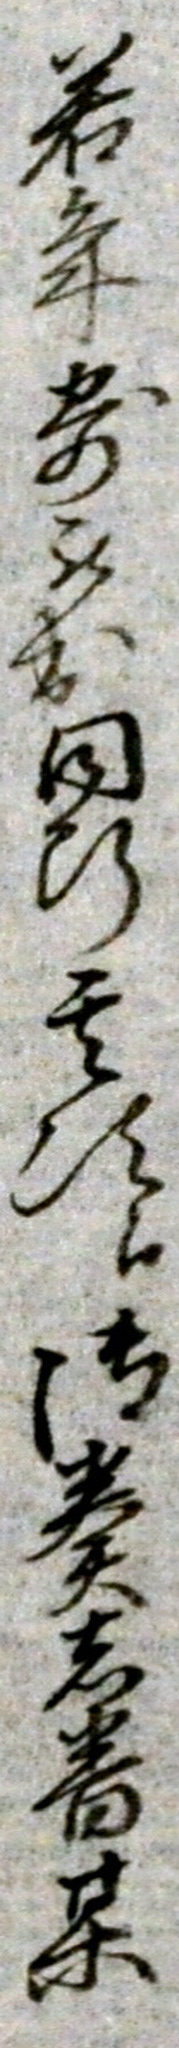若年寄被出同断其次え御奏者番某
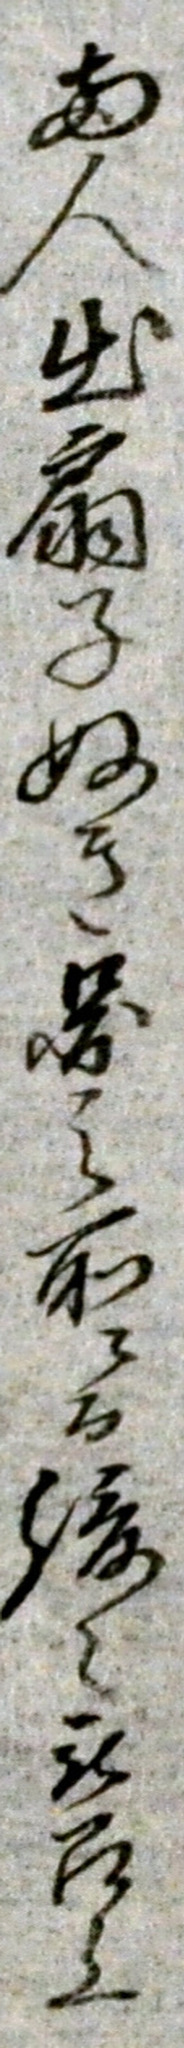両人出扇子ぬき圖之所ニ而後々被召上
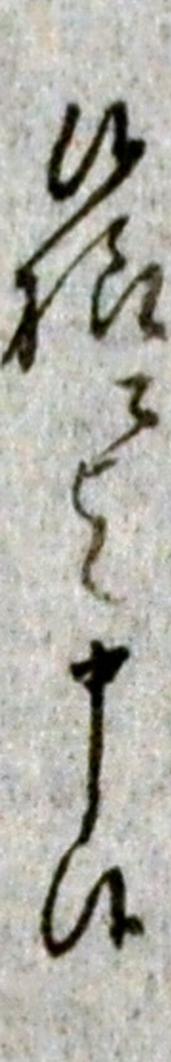候様ニ与申候
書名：竹ノ間御座席奉行勤方控外
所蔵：伊那市立高遠町図書館・合同会社AMANE
